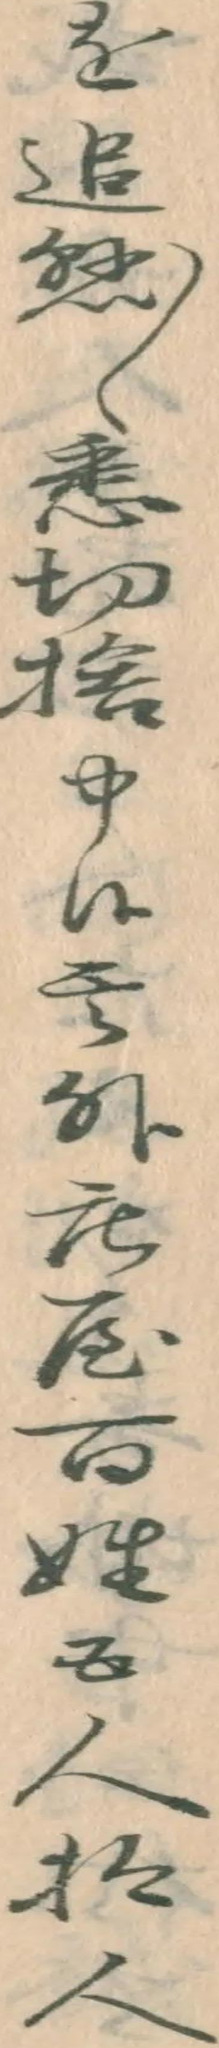を追懸〱悉切捨申候其外庄屋百姓五人拾人

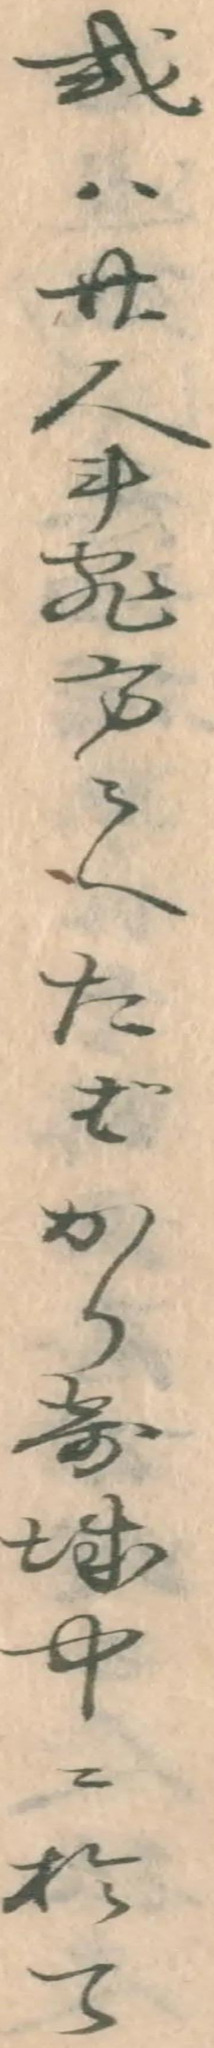或は廿人斗究方々へたばかり寄城中に於て
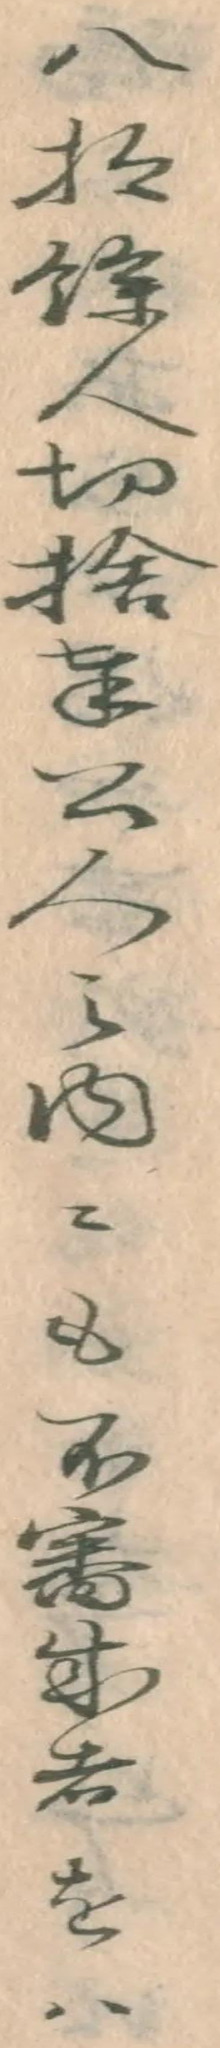八拾余人切捨奉公人之内にも不審成者をは
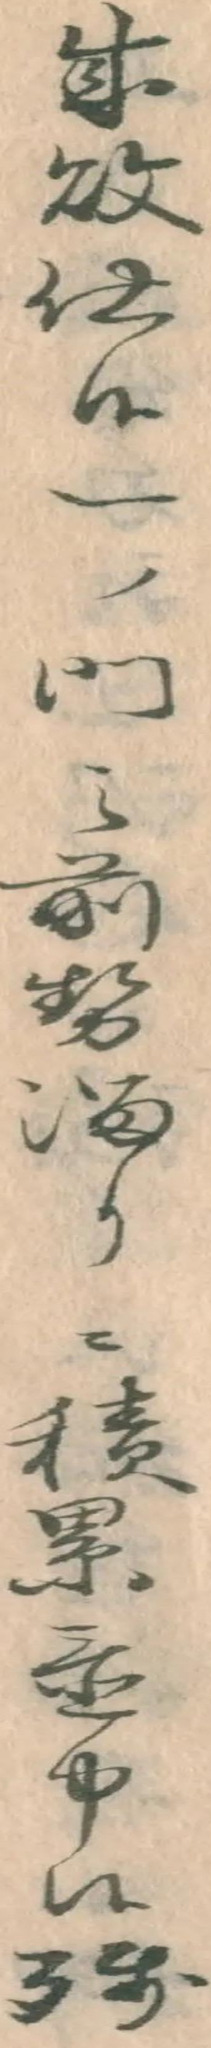成敗仕候一之内之前勢溜りに積累置申候残
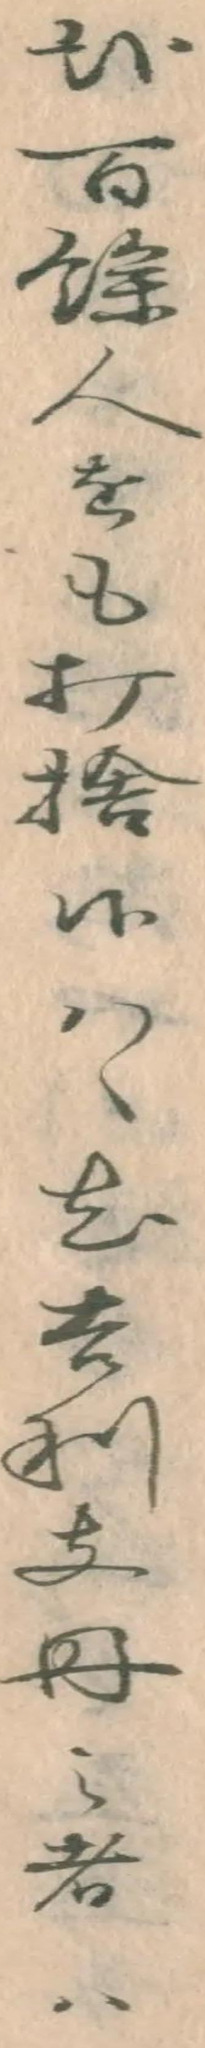哉百余人をも打捨候はゝ尤吉利支丹之者は
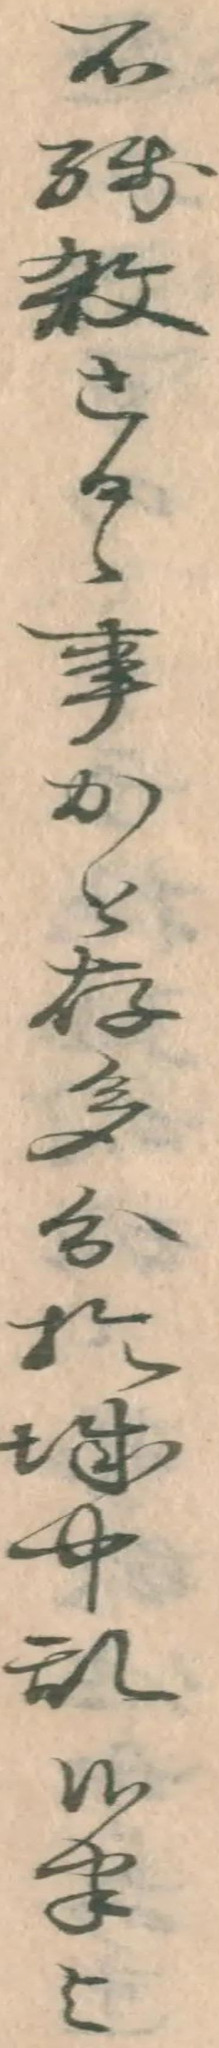不残殺さるゝ事かと存多分於城中乱候半与
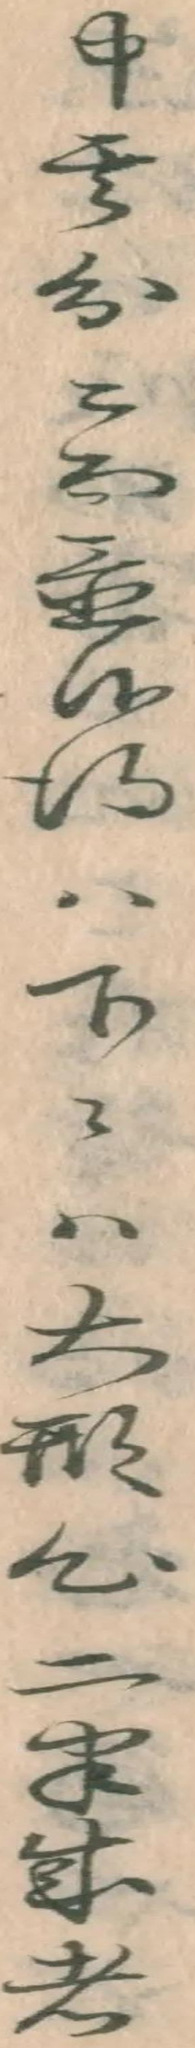申其分に而候置得は下々は大形心二半成者
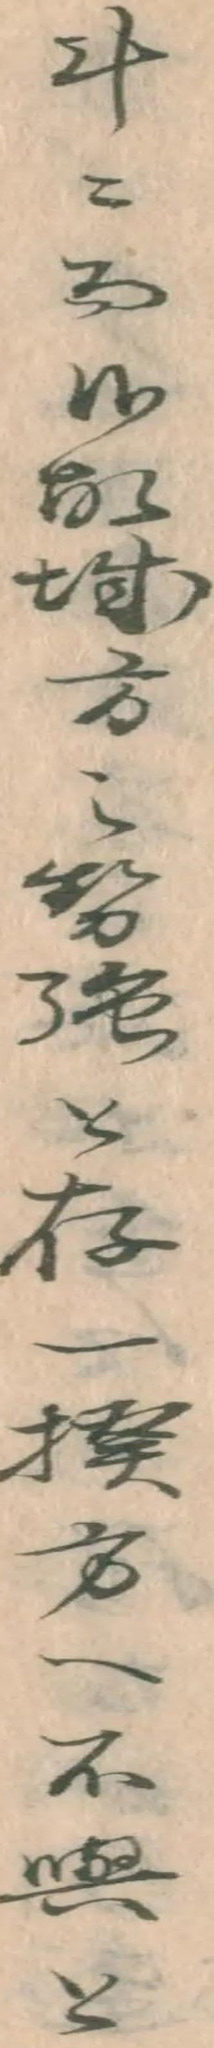斗に而候故城方之勢強と存一揆方へ不興と
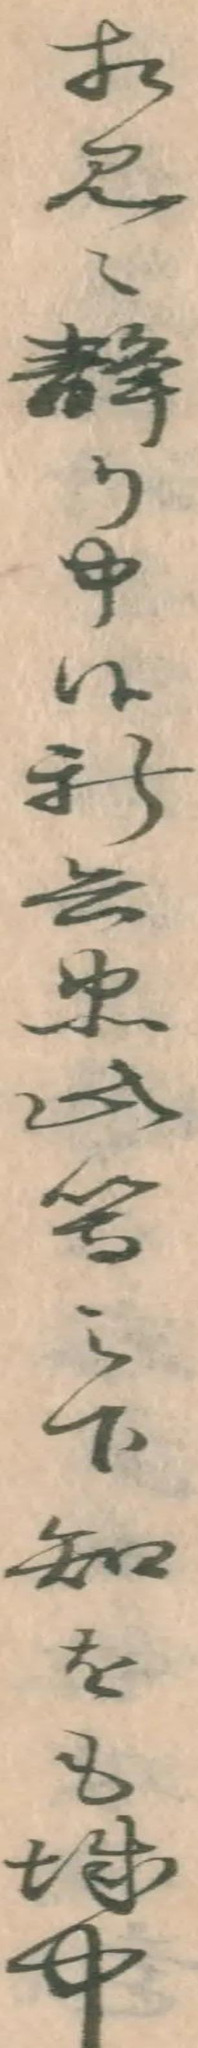相見之静り申候新兵衛此等之下知をも城中
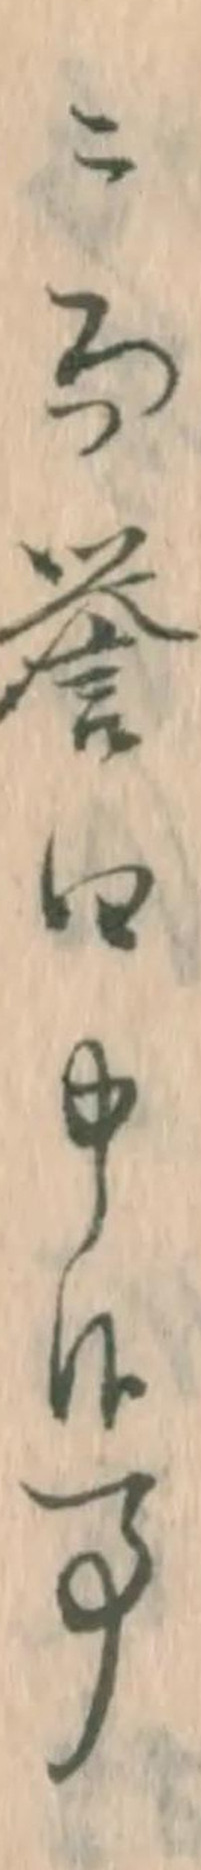に而誉口申候事
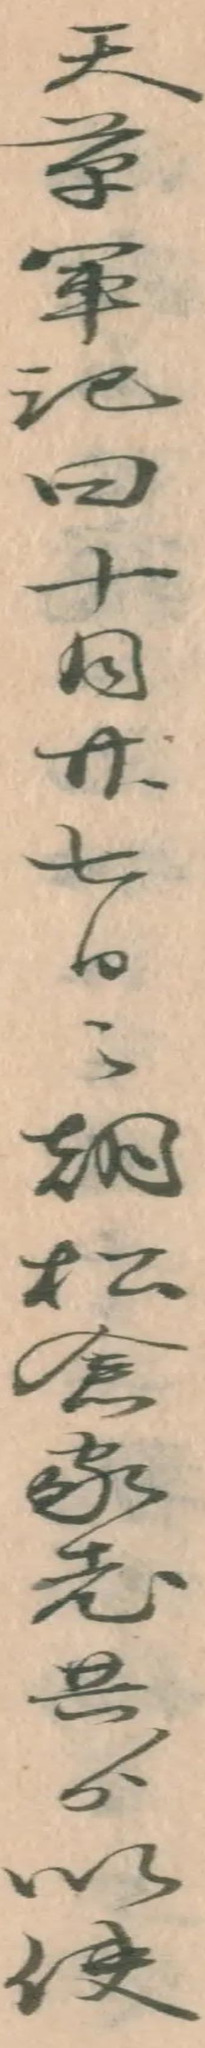天草軍記曰十月廿七日之朝松倉家老共ゟ以使
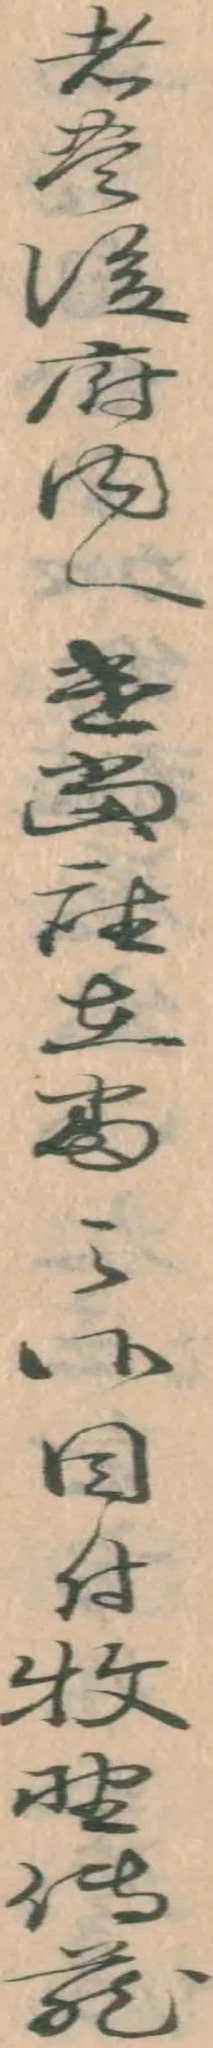者豊後府内へ遣当座在番之御目付牧野伝蔵
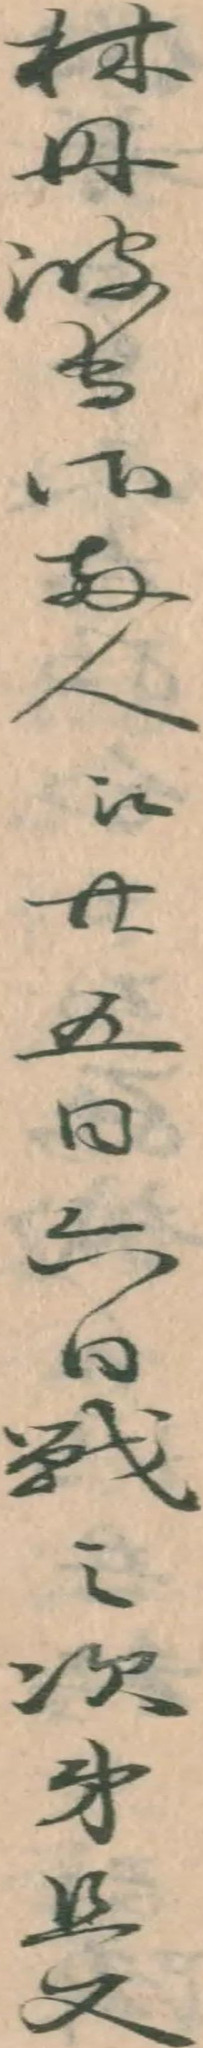林丹波守御両人江廿五日六日戦之次第且又
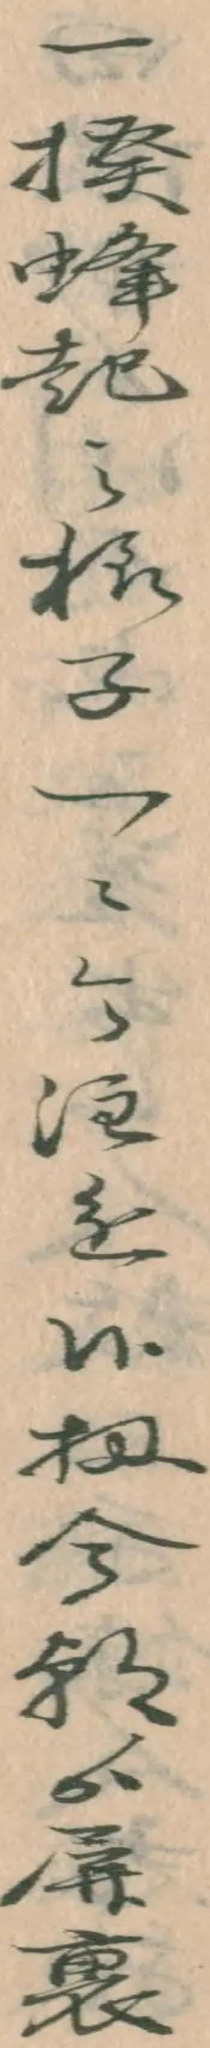一揆蜂起之様子一々令注進候扨今朝ゟ屏裏
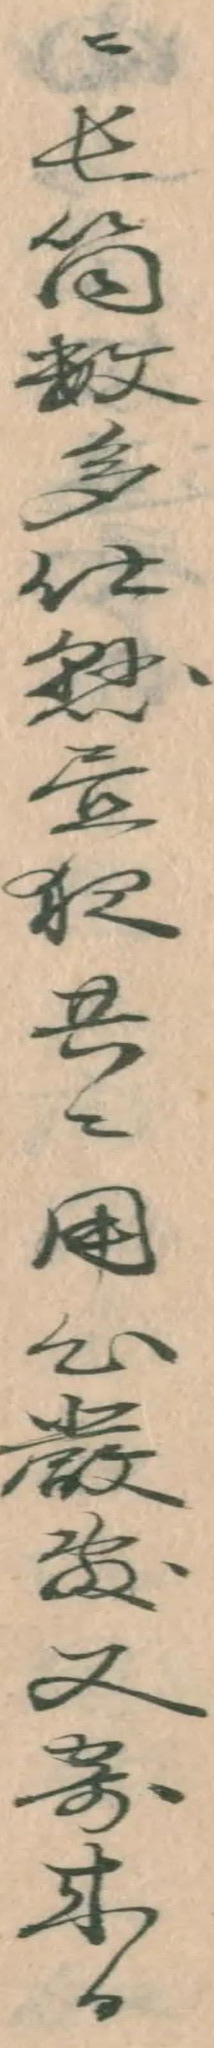に長筒数多仕懸昼夜共に用心厳敷又寄来る
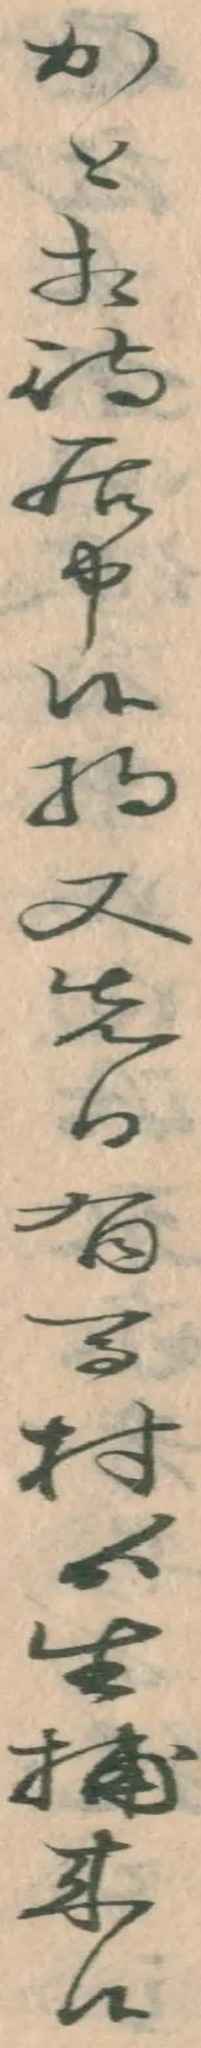かと相待居申候扨又先日有馬村ゟ生捕来候
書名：切支丹御退治記 49巻. [2]
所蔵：国立国会図書館 National Diet Library, JAPAN
